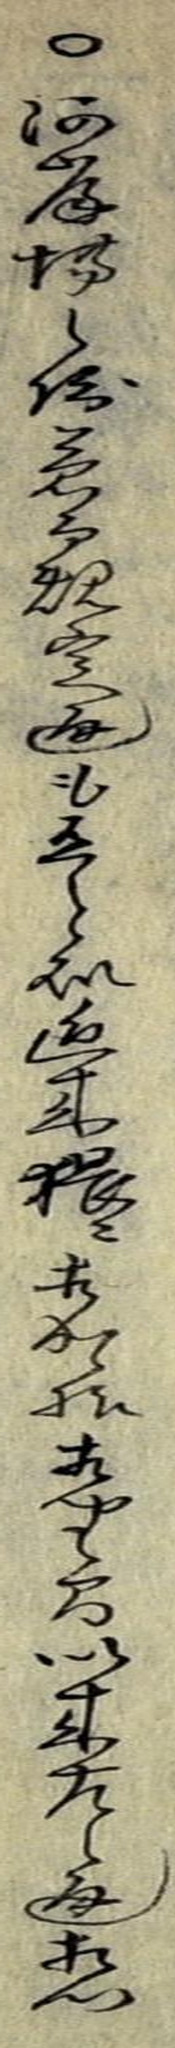○河岸場之儀兼而規定通も有之候処近来猥ニ相成候様相聞候間以来左之通相心
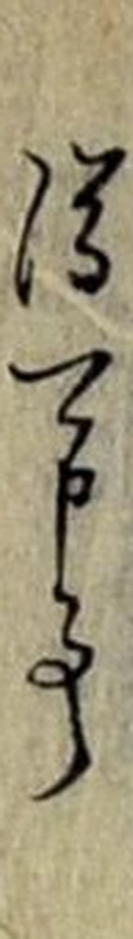得可申事
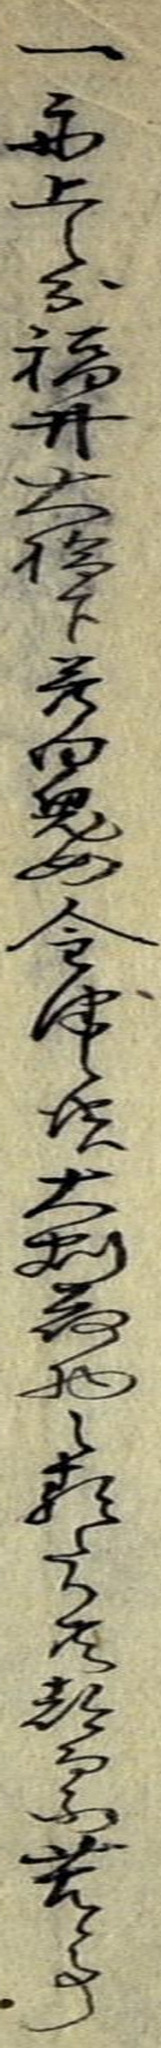一舟上之分福井大橋下并白鬼女金津之儀ハ大判荷物之類たり共都而不苦候事
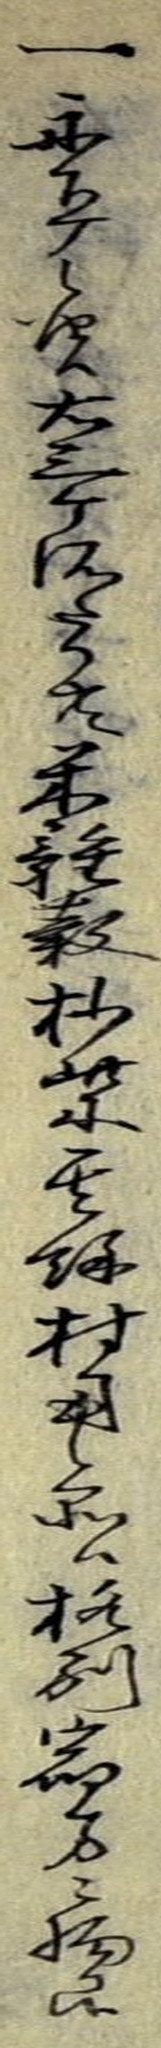一舟下ケ之儀ハ右三ケ所たり共米雑穀杪柴其余村用之品ハ格別宿方ニ拘り候
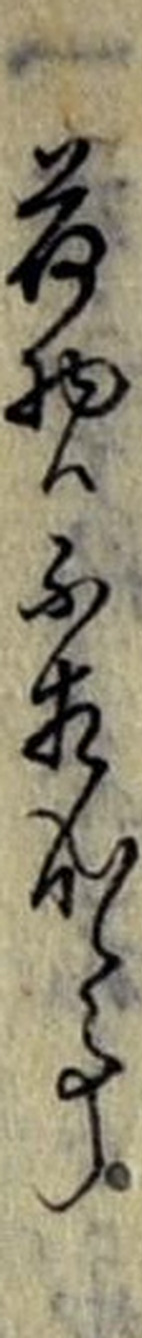荷物ハ不相成候事

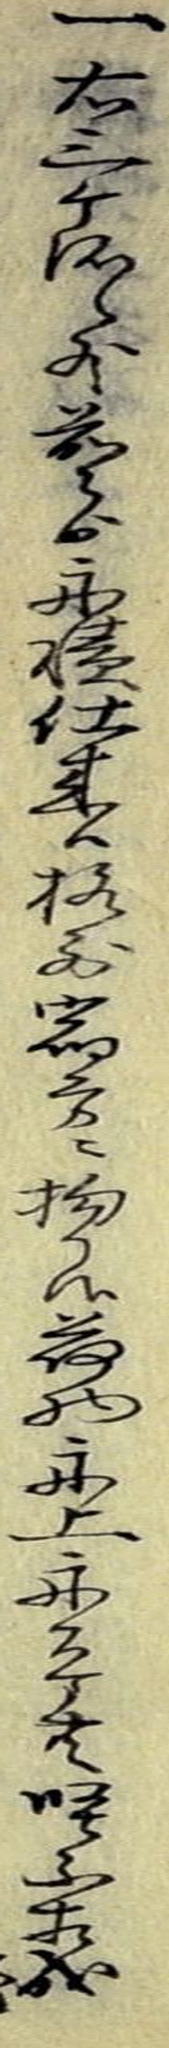一右三ケ所之外前々ゟ舟積仕来ハ格別宿方ニ拘り候荷物舟上舟下ケ共堅不相成事
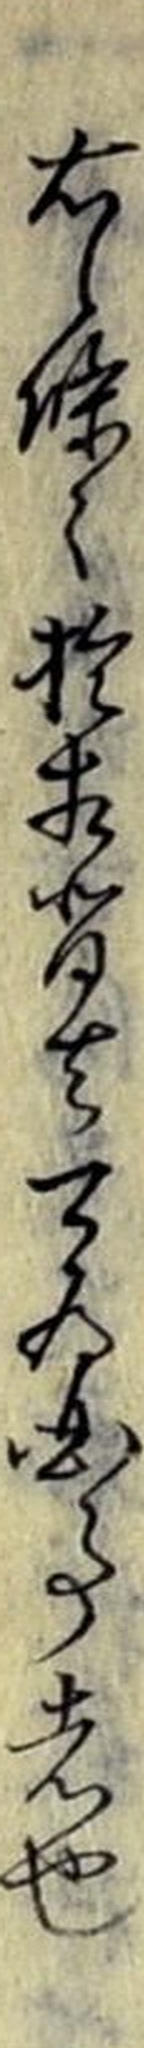右之条々於相背者可為国事者也
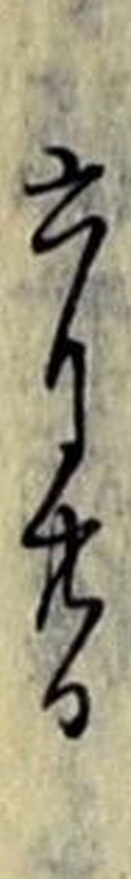六月廿日
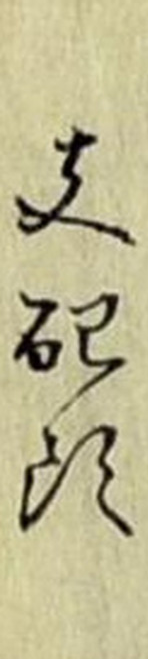支配頭
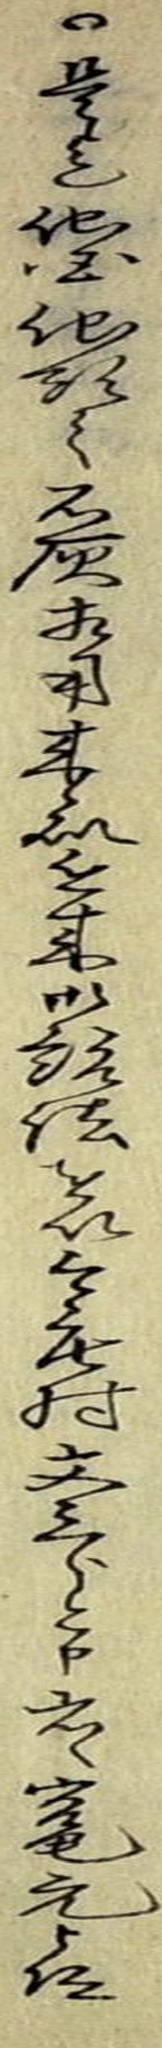〇是迄他国他領之石灰相用来候処近来御趣法を以今庄村文三郎と申者へ竃元被仰
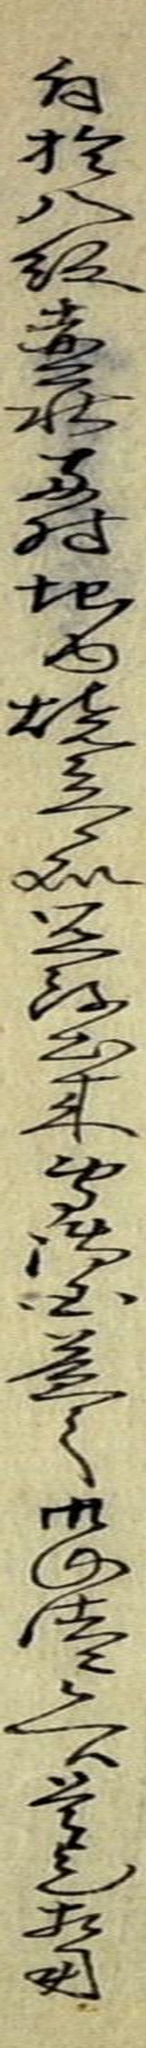付於八飯赤萩両村地内焼立候処宜致出来専御国益之御趣法ニ候へハ是迄相用
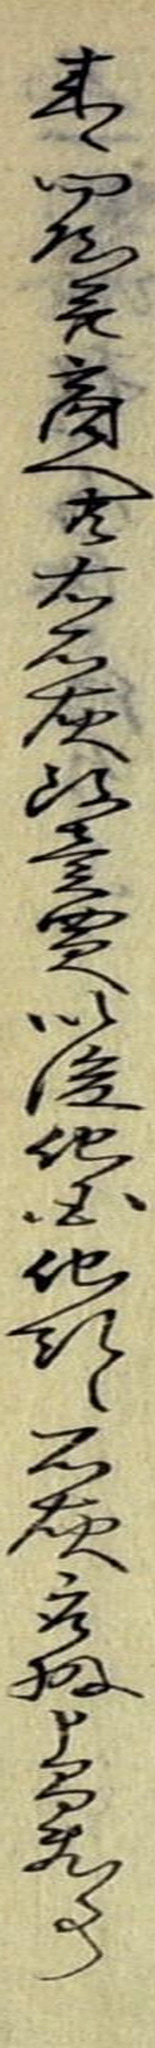来候問屋并商人共右石灰致売買以後他国他領之石灰取扱申間敷事
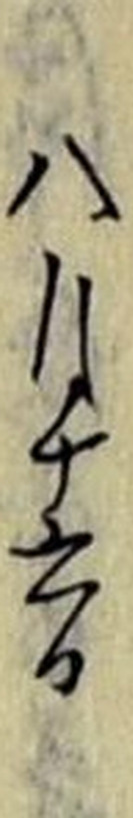八月廿五日
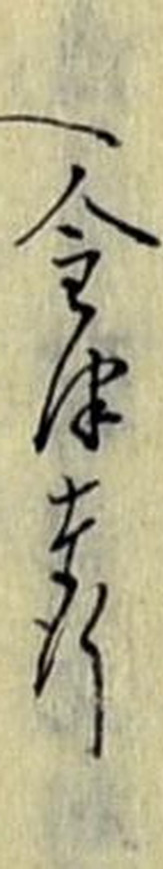金津奉行
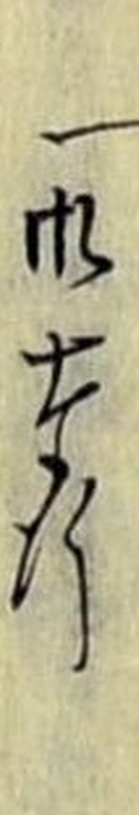御奉行
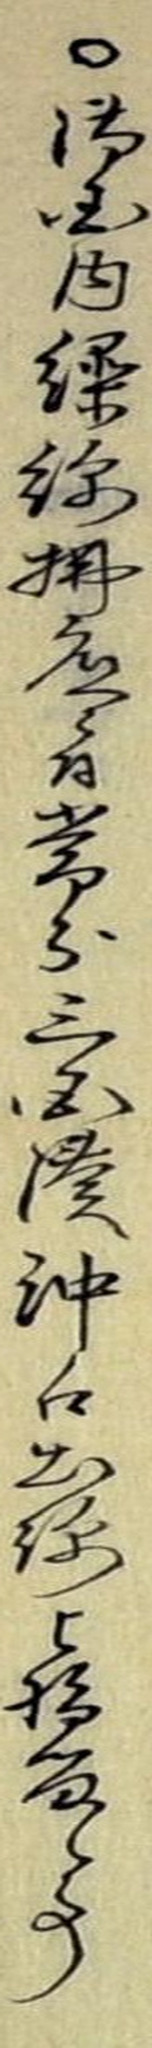〇御国内繰綿払底ニ付当分三国湊沖ノ口出綿被指留候事
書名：命令之部 五
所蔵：福井県文書館 Fukui Prefectural Archives
